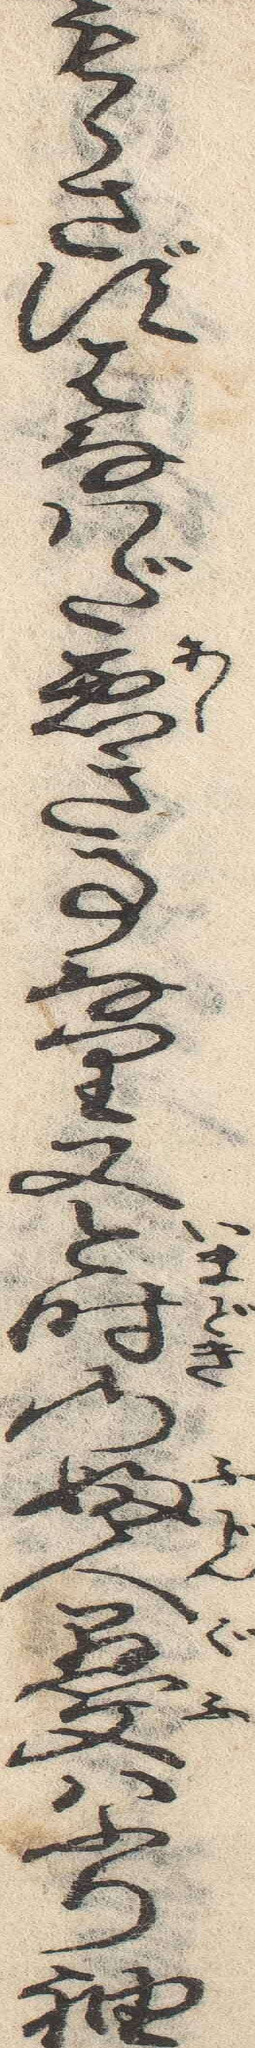もらさずはなはだ悪き事なり又今時の婦人愚父はふり袖
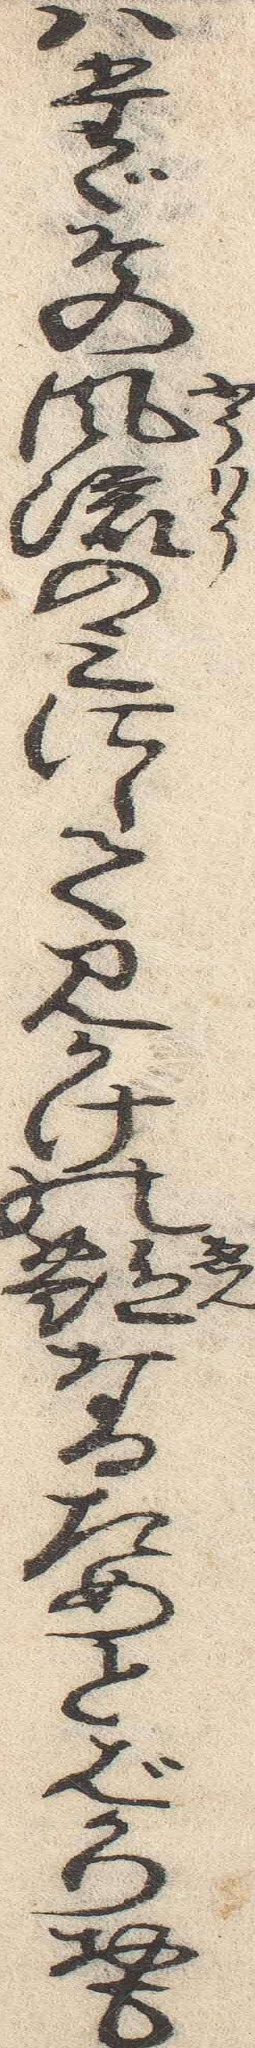はたゞその風流のみにして見かけの艶なるためとばかりおも
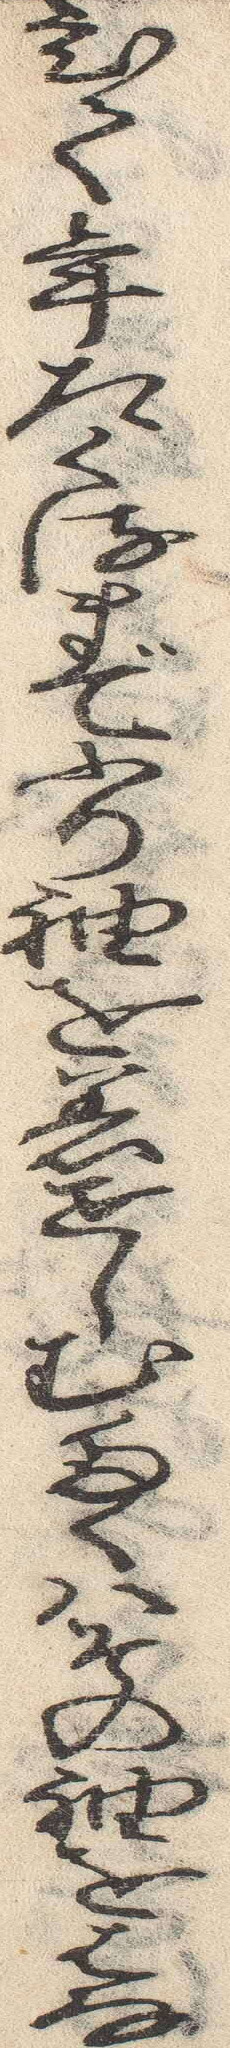ひて年たくるまでふり袖を着せしむ多くはその袖をはな
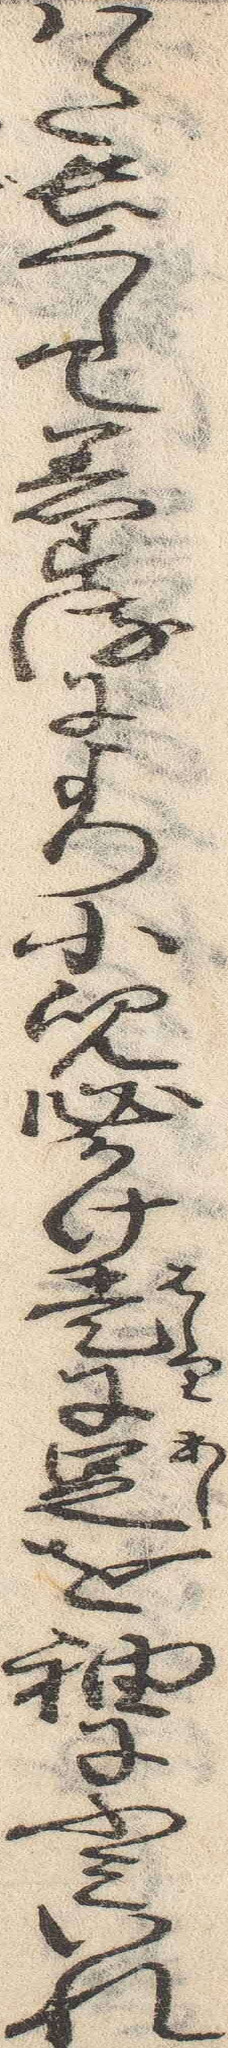はた長くして着するにより小児必かけ走に足を袖にふみいれ
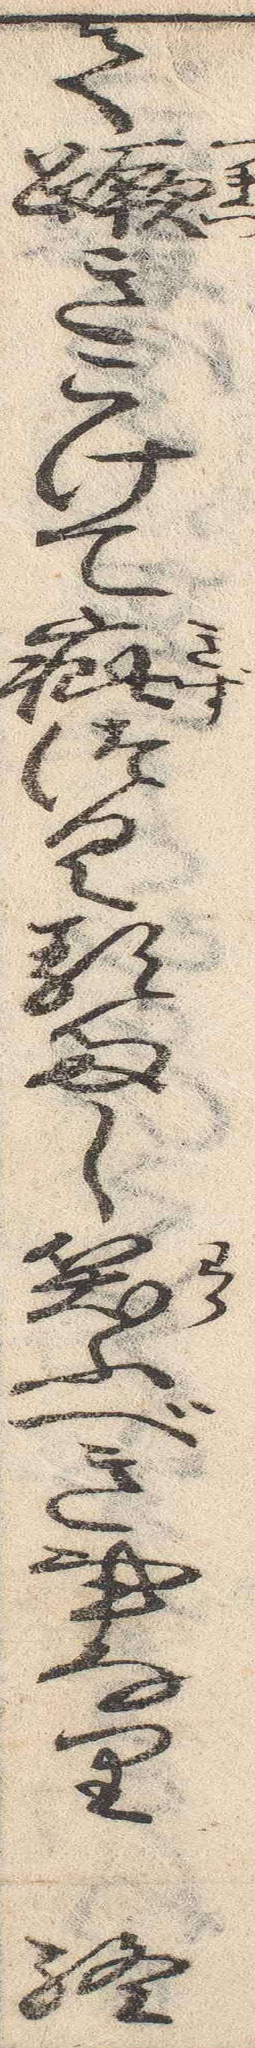て蹶きこけて疵つくる多し笑ふべき事なり終

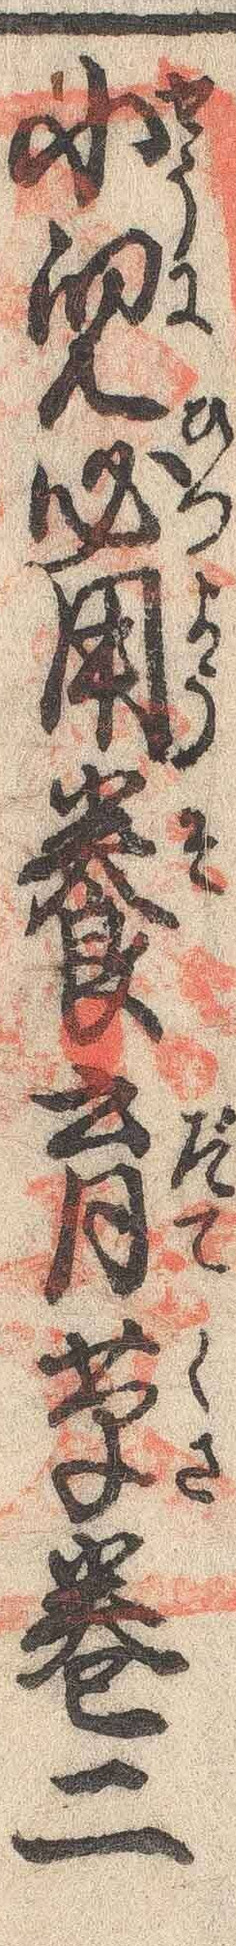小兒必用養育草巻二
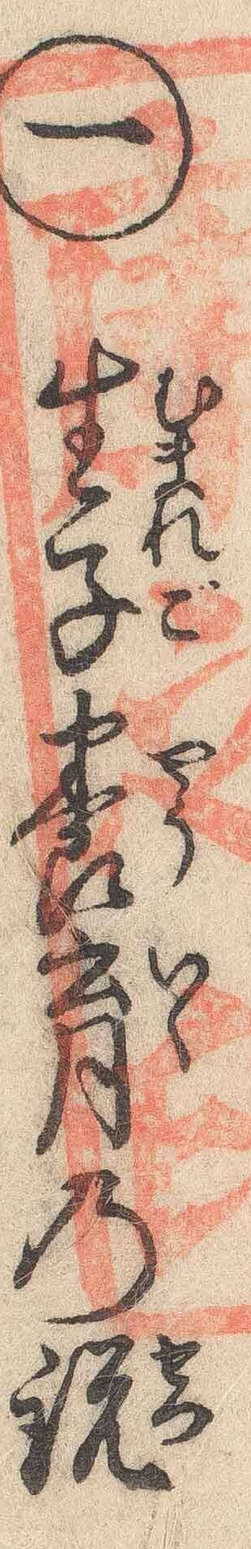㊀生子養育の説
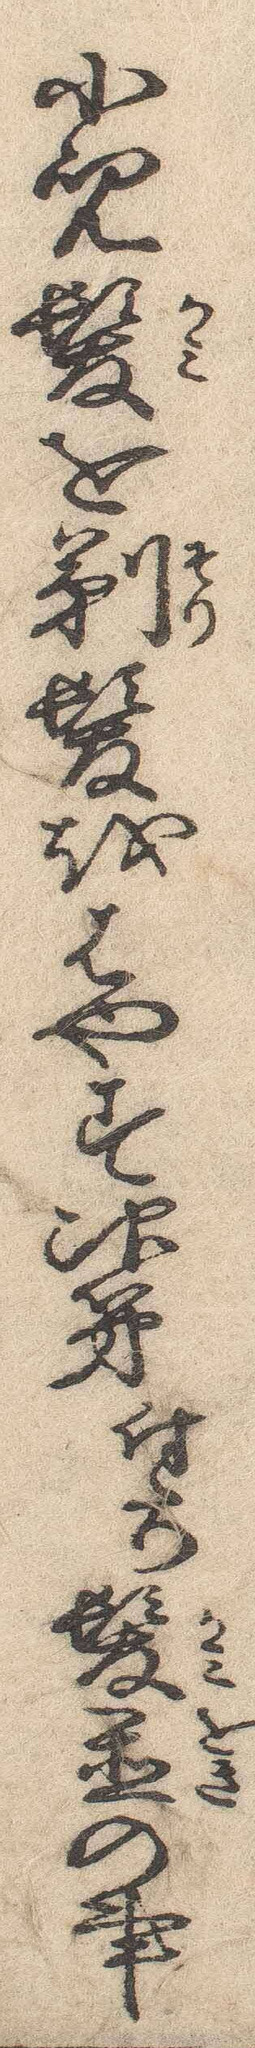㊂小児髪を剃髪をはやす次第付たり髪置の事
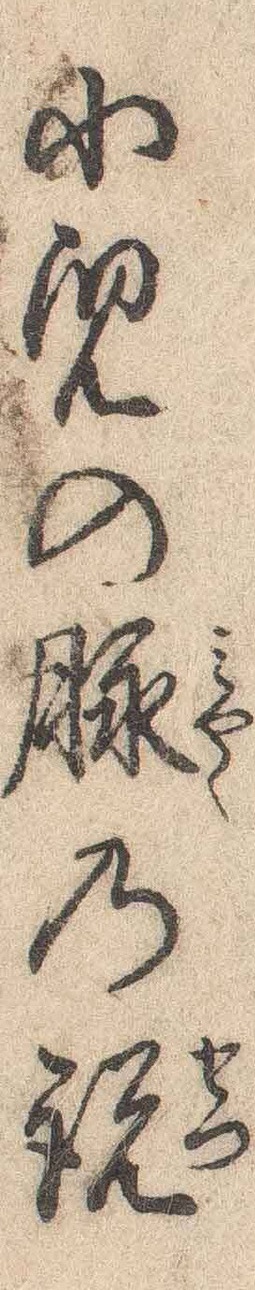㊄小児の脈の説
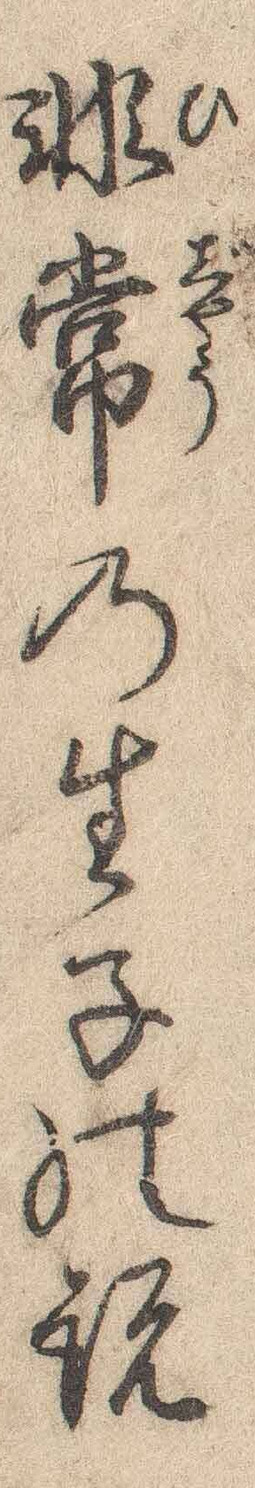㊅非常の生子の説

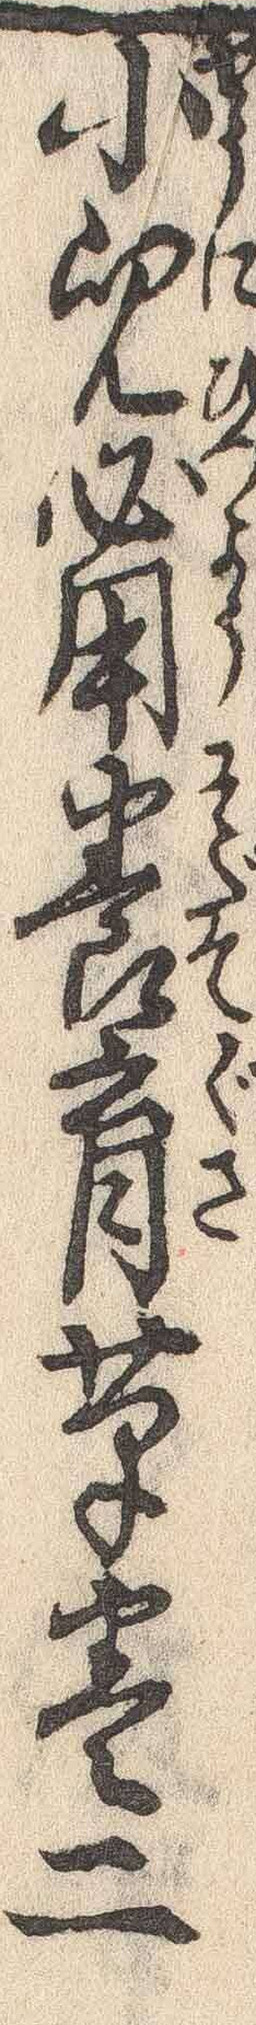小兒必用養育草巻二
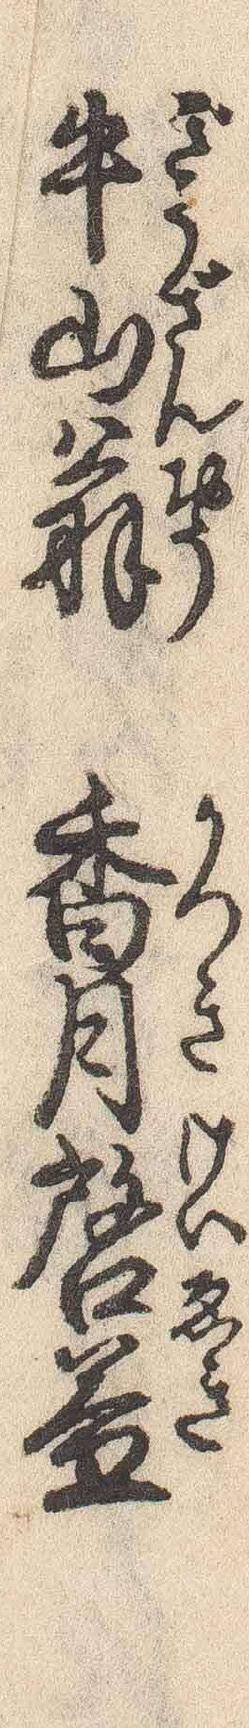牛山翁香月啓益
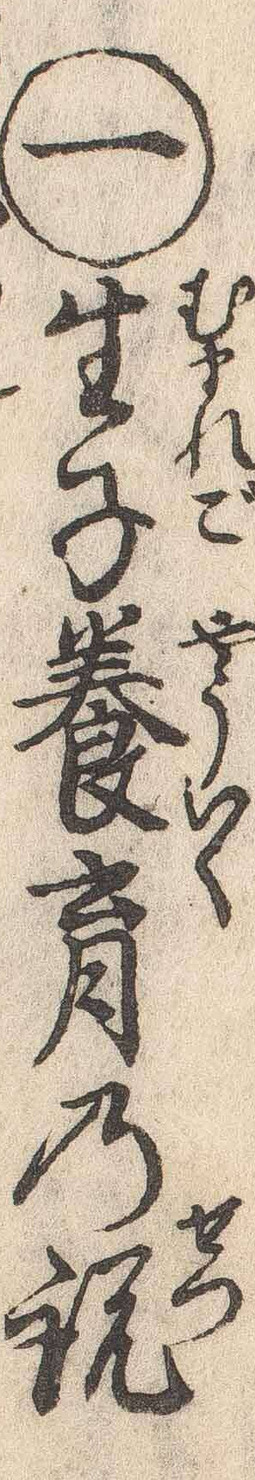㊀生子養育の説
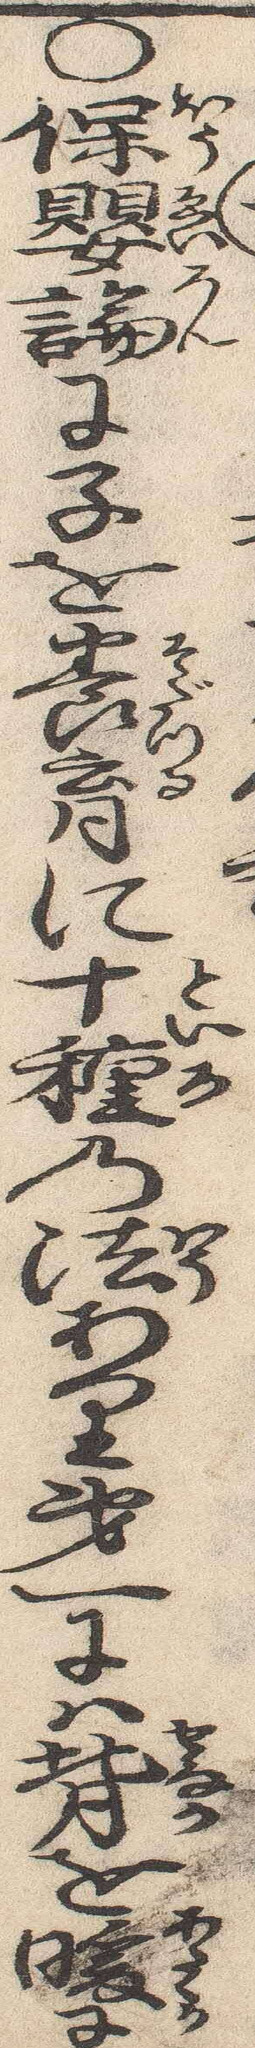◯保嬰論に子を養育に十種の法あり第一には背を暖に
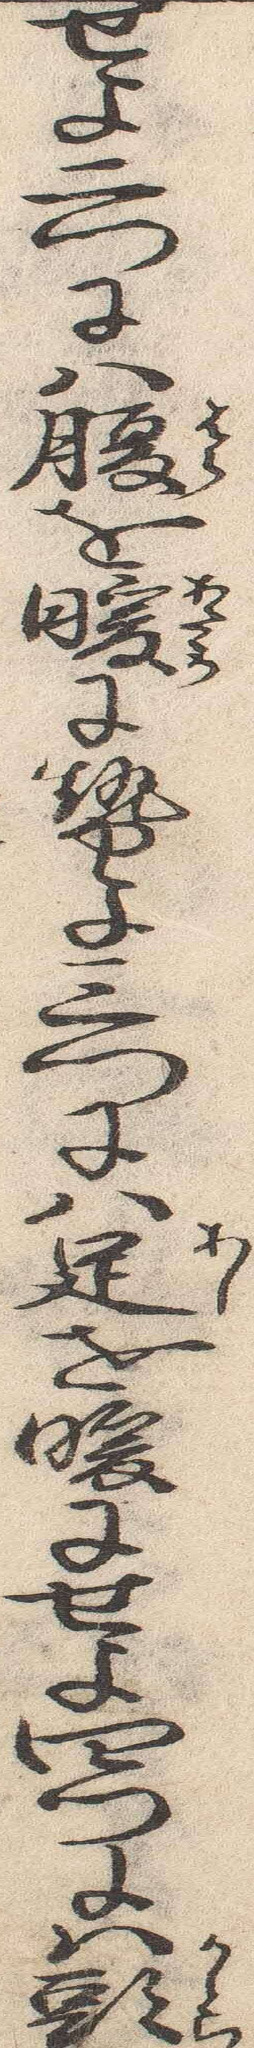せよ二つに腹を暖にせよ三つに足を暖にせよ四つには頭
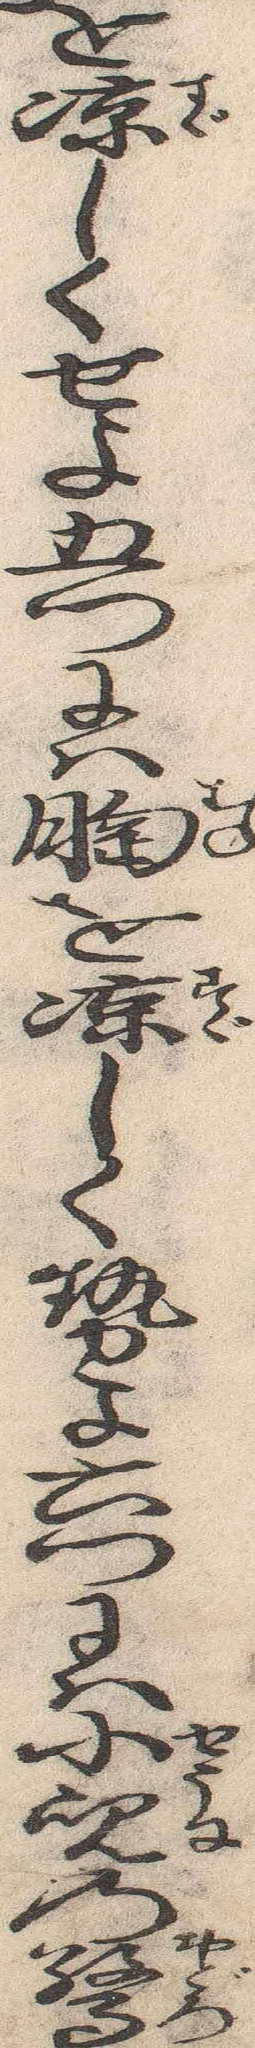を涼しくせよ五つには胸を涼しくせよ六つには小児の驚
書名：小児必用養育草
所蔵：東京学芸大学附属図書館 国文学研究資料館
